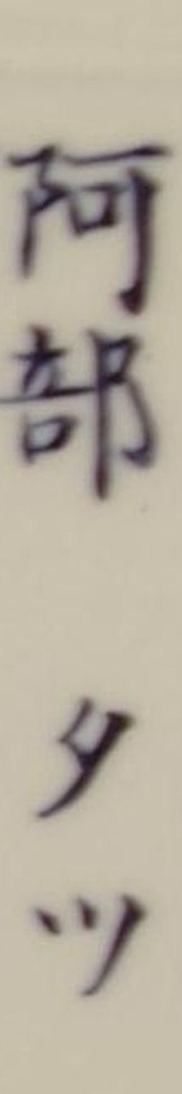阿部タツ
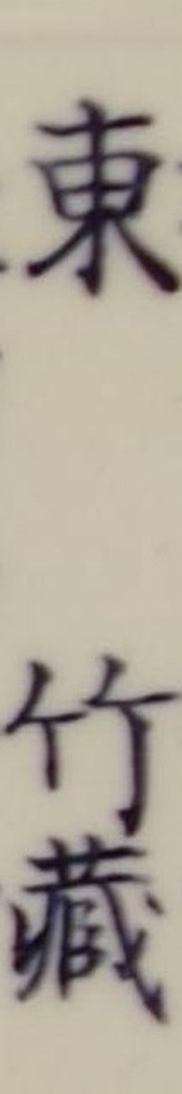東竹蔵
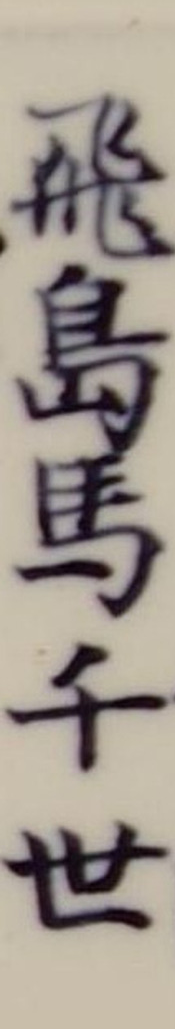飛島馬千世
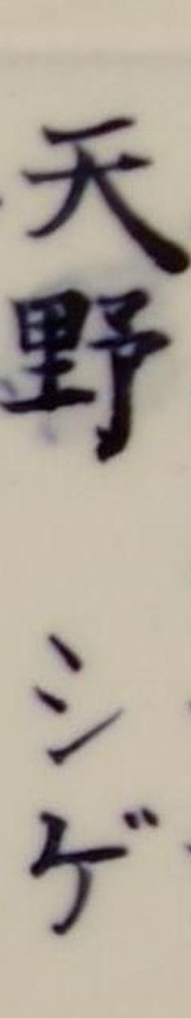天野シゲ
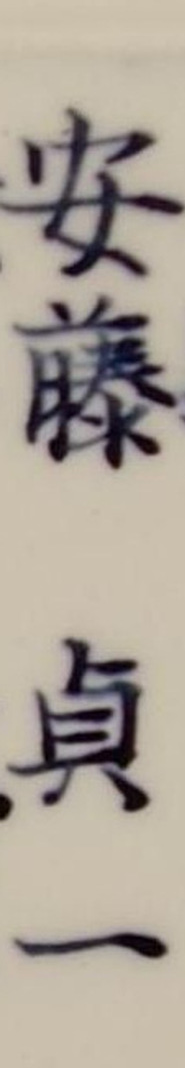安藤貞一
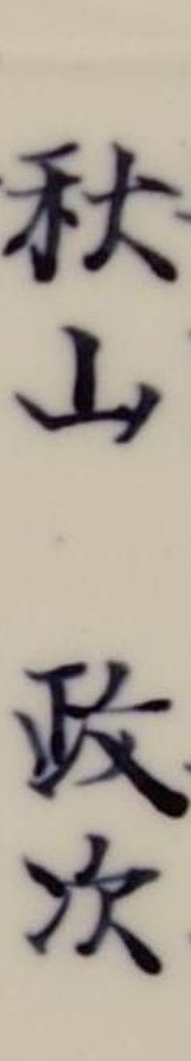秋山政次
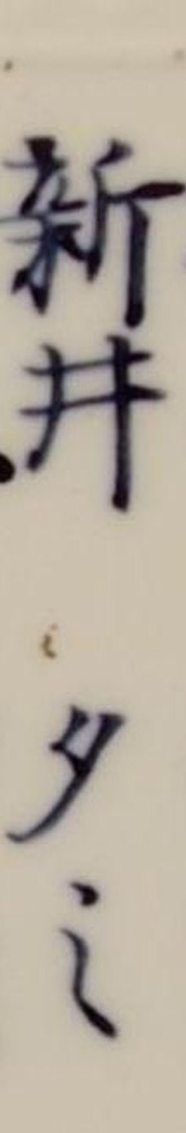新井タミ
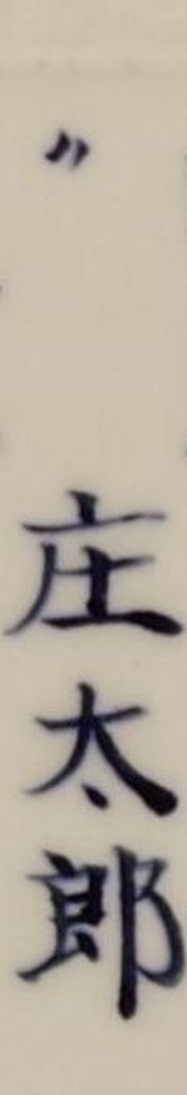庄太郎
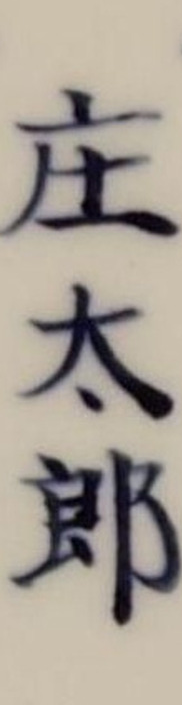庄太郎
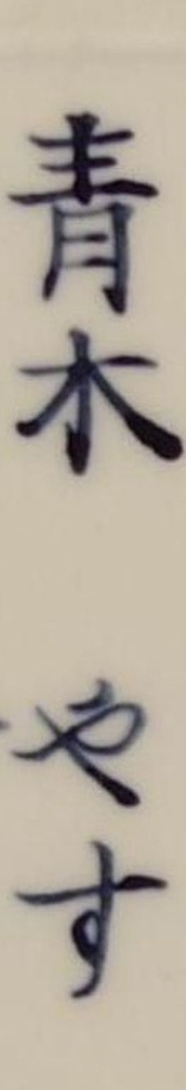青木やす
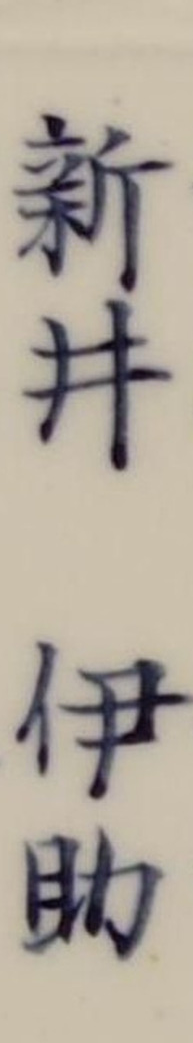新井伊助
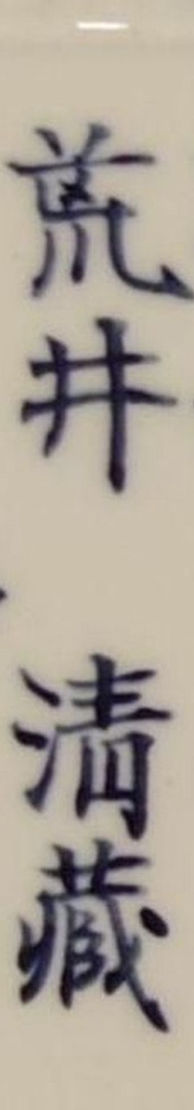荒井清蔵
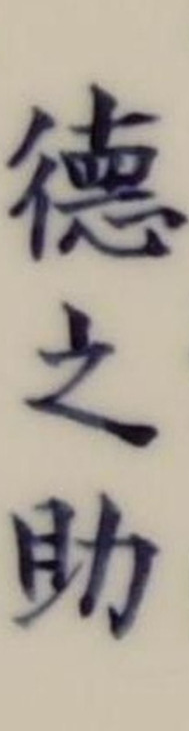徳之助
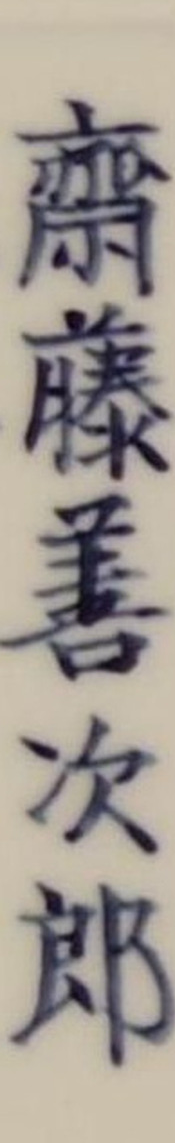斎藤善次郎

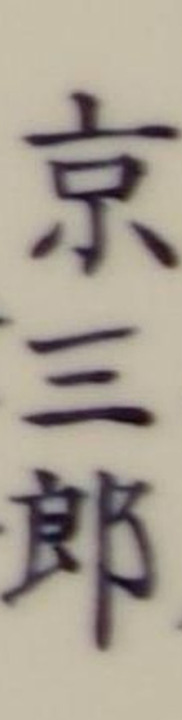京三郎
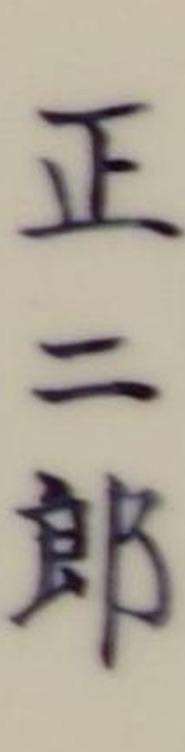正二郎
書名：E~L
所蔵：高野山金剛峯寺
